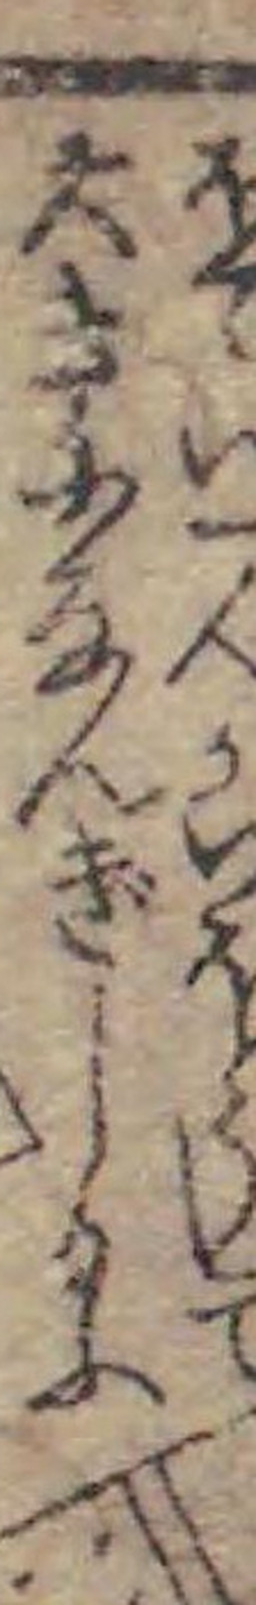大きになんぎし給ふ
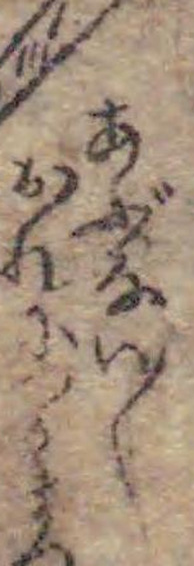あぶない〳〵
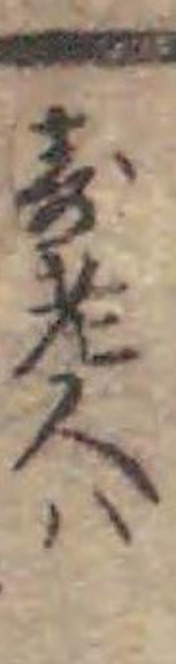寿老人は
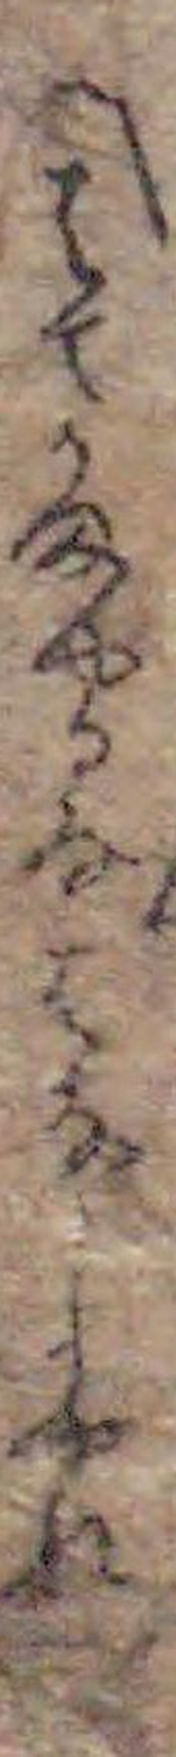〽はてかまやるなはなしやれ
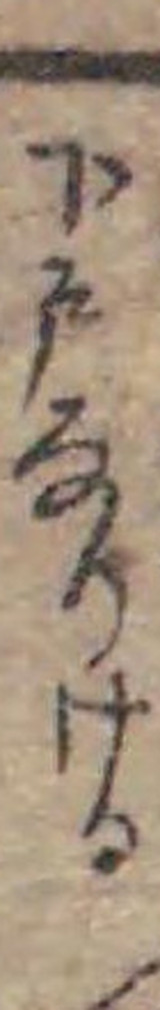下戸なりける
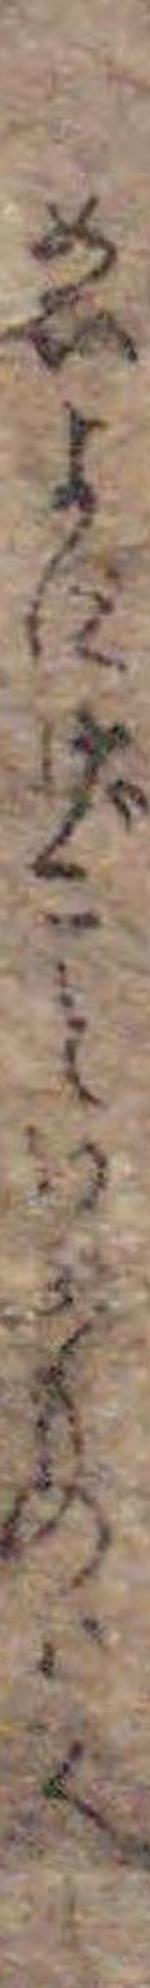めいよげこといふものは
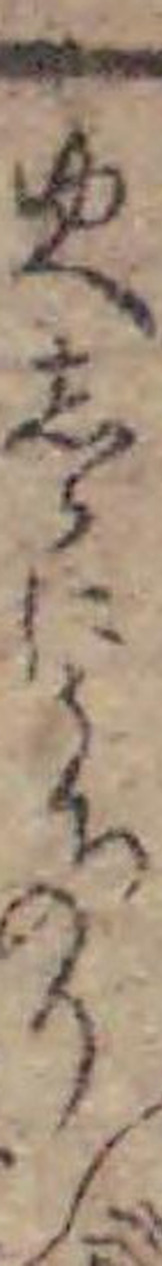ゆへしかにうちのり
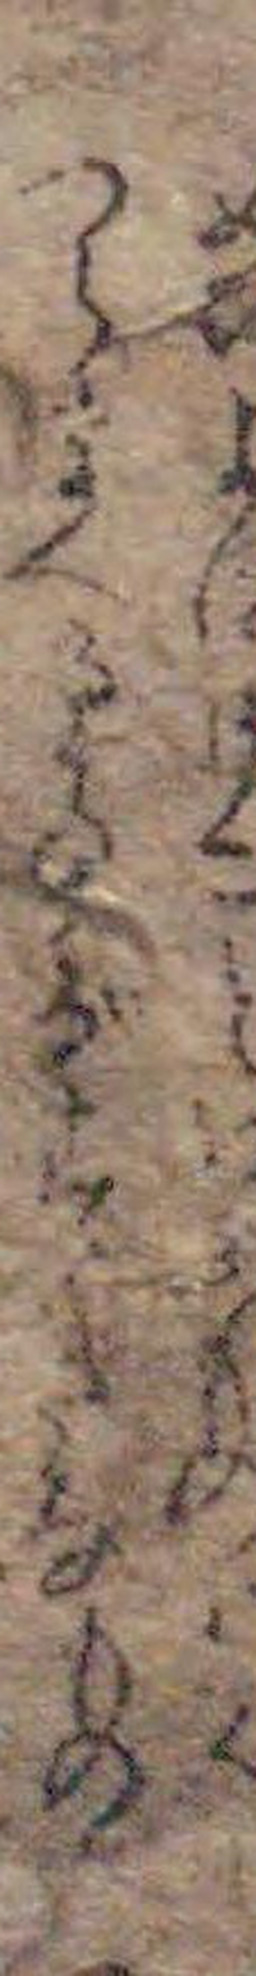つらまへる事がすきなもの
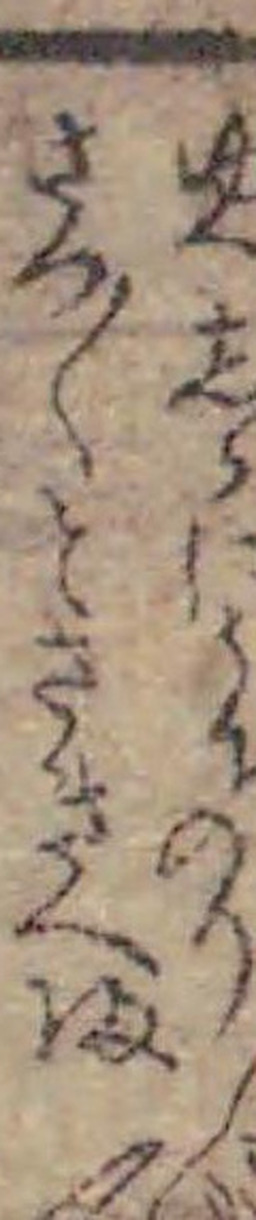さつ〳〵とさきへ帰
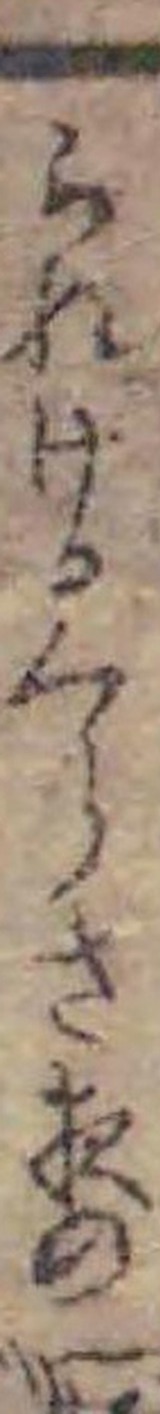られけるくらき夜の
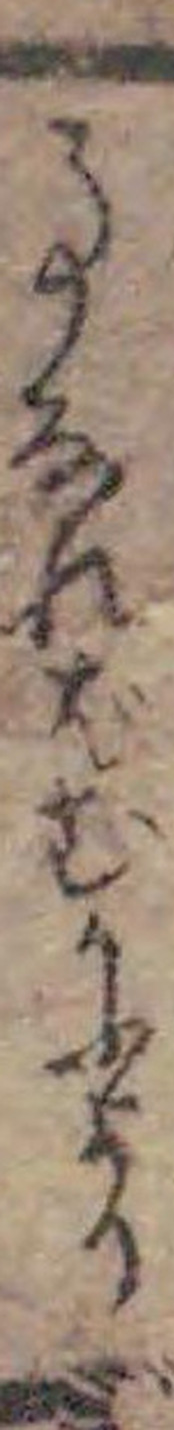事なればむかふより
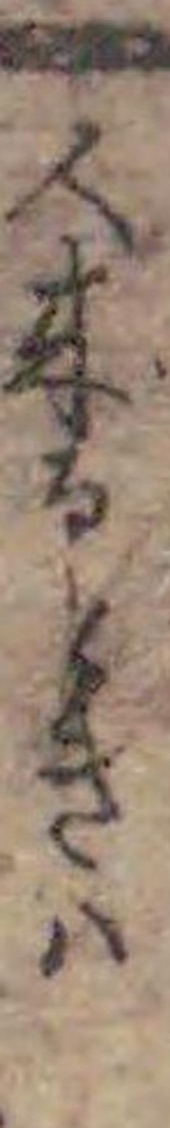人来るときは
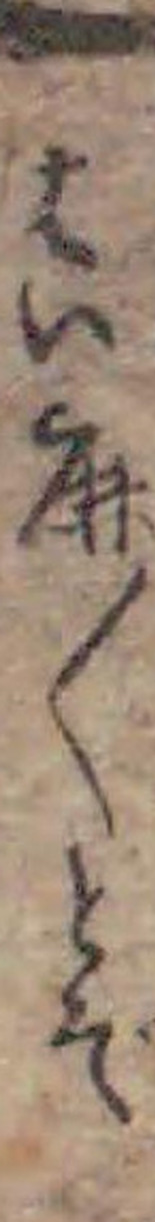はい鹿〳〵とぞ
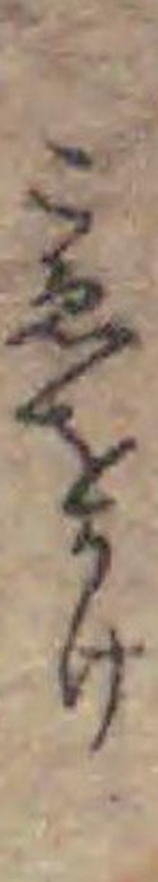こゑをかけ

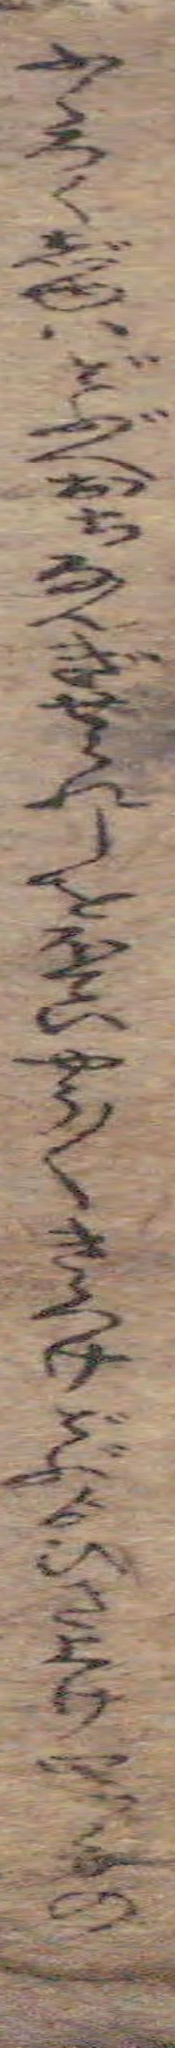ふくろくじゆはどぶへおちなんぎせられしをほていやう〳〵きゝつけどぶよりひき上げ四つ手の
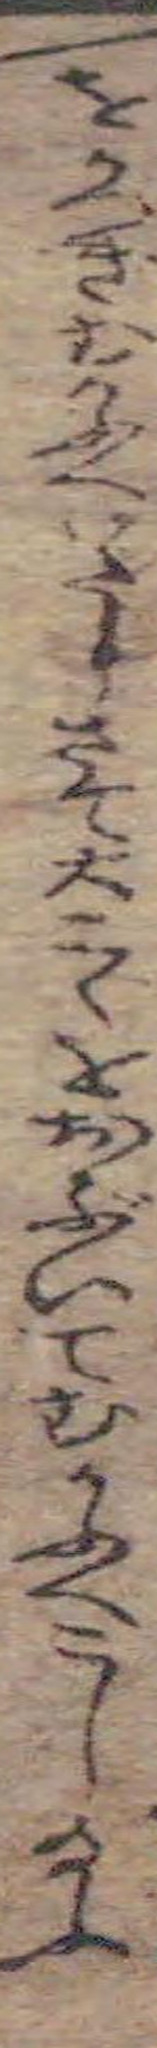をかつぎむかふへいたしさて大こくをおぶいてむかふへこし給ふ
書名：蛭子大黒壮年過 : 2巻
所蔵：国立国会図書館 National Diet Library, JAPAN
